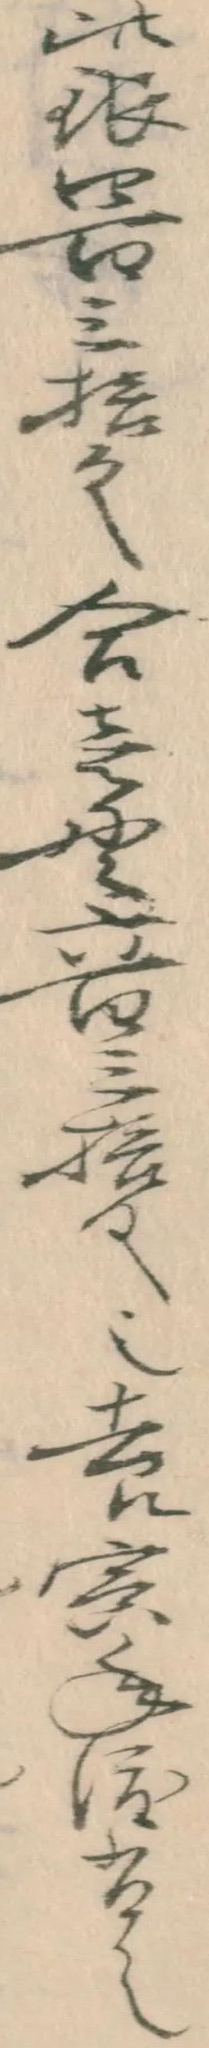此銀四百三拾匁合壱貫六百三十匁也去ル寅年渡有之
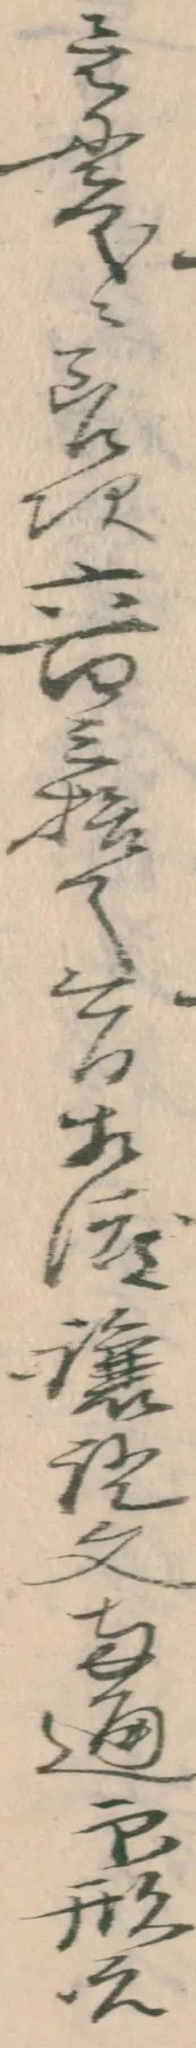壱貫匁ニ差次六百三拾匁今日相渡譲證文両通印形取
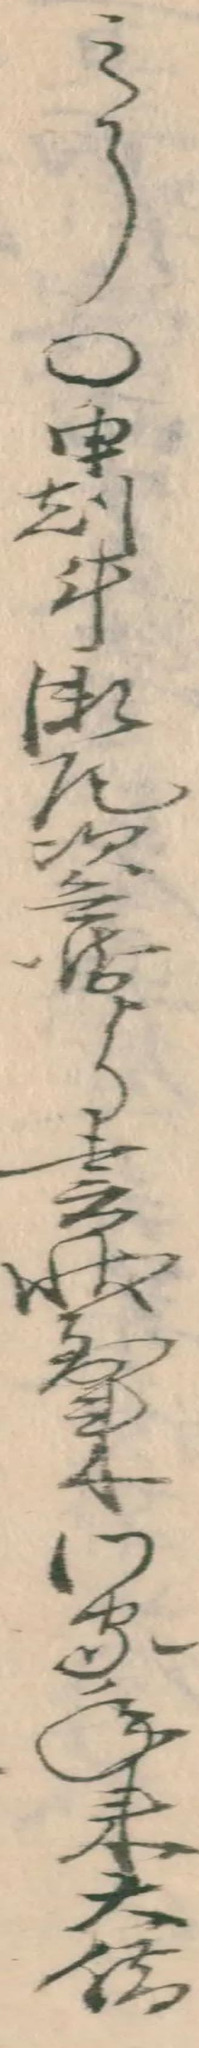之了○申刻斗瀬尾次兵衛より書状到来同家年来大借
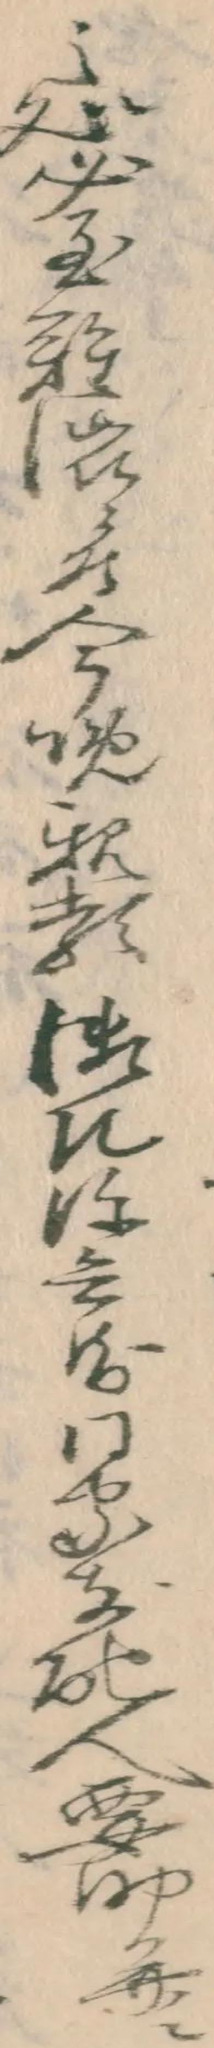之処必至難渋ニ付今晩親類御比弥兵衛同家支配人要助并ニ
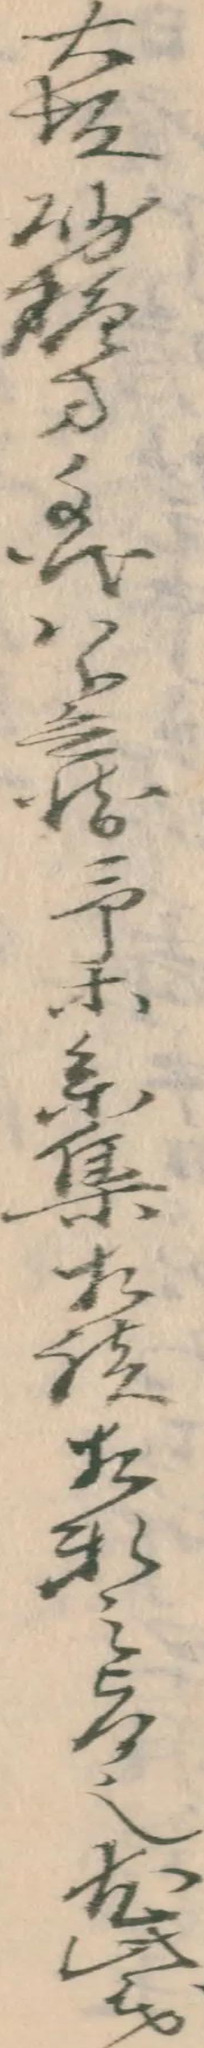大坂砂糖方手代八郎兵衛予等参集相談相頼之旨也尤此度
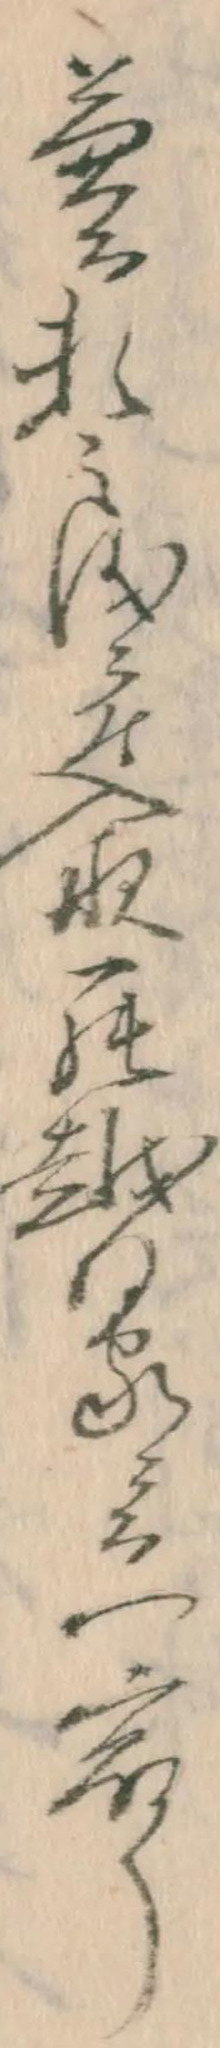兼而頼之儀ニ付入夜罷越同家ニ而一宿了
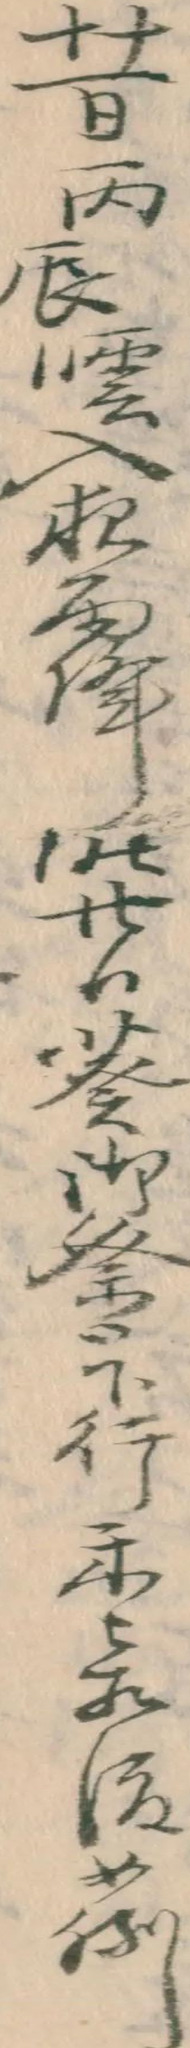廿一日丙辰曇入夜雨降昨廿日葵御祭御下行米被相渡如例
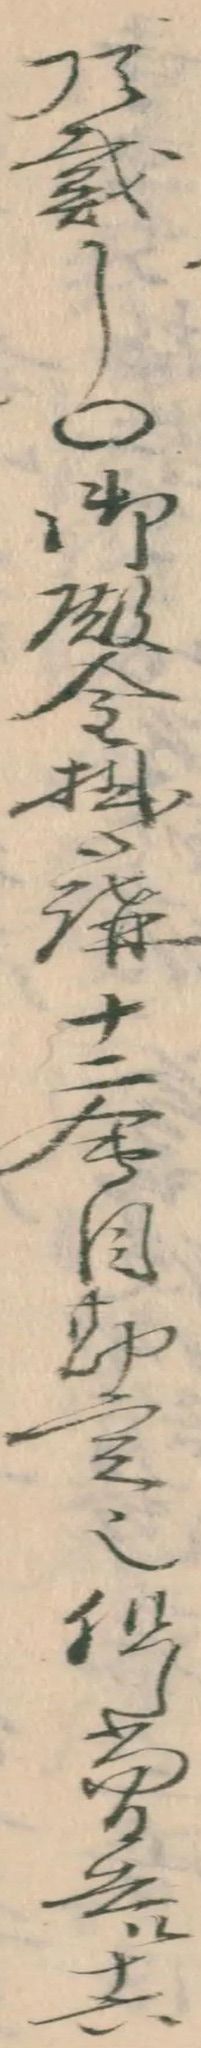頂戴了◯御殿金掛ハ講十二會目勘定也但し當日去ル十六
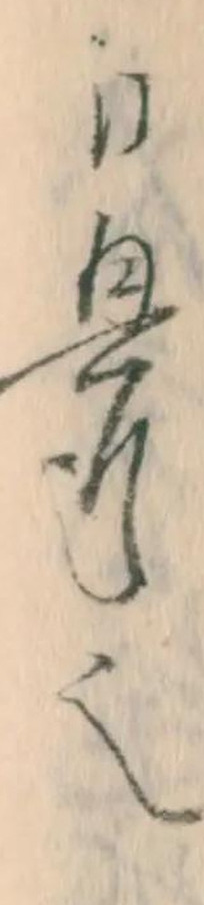日興行也
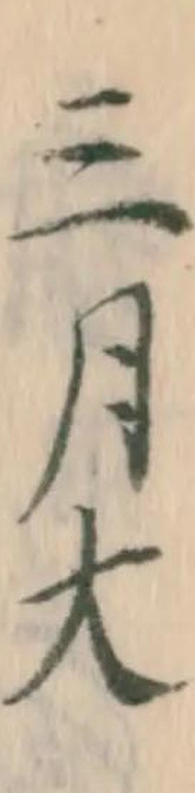三月大
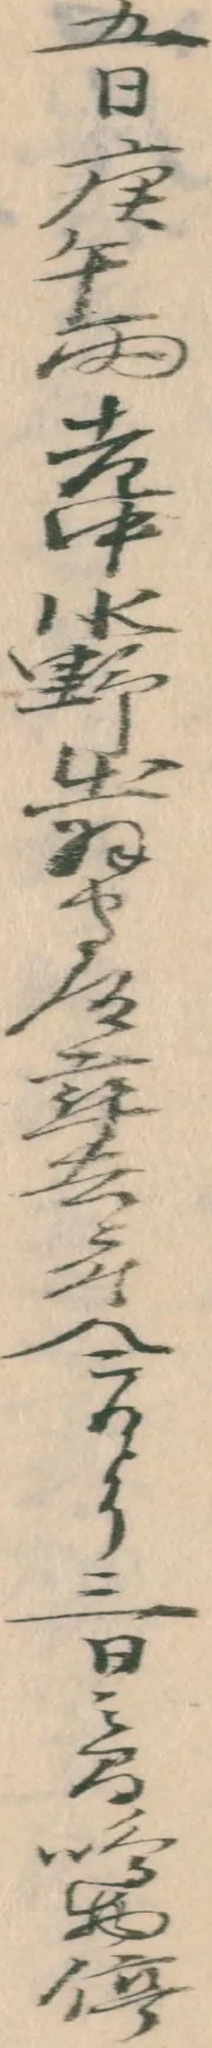五日庚午雨老中水野出羽守殿卒去ニ付今日より三日之間鳴物停
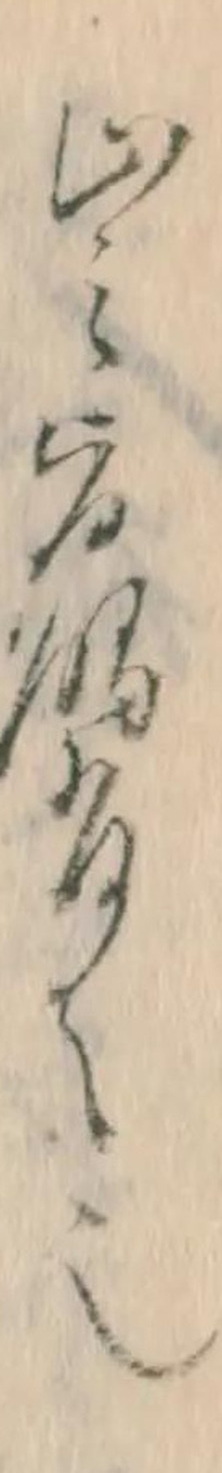止之旨觸有之也
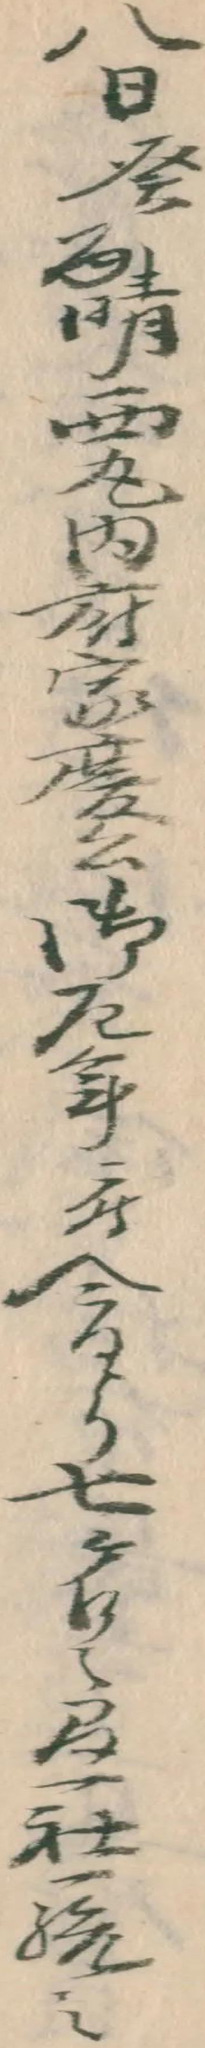八日癸酉晴西丸内府家慶公御厄年ニ付今日より七ケ日之間一社一統之
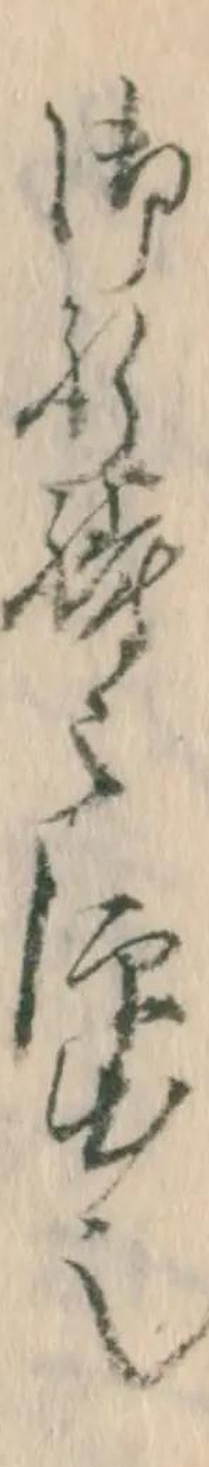御祈祷之仰出也
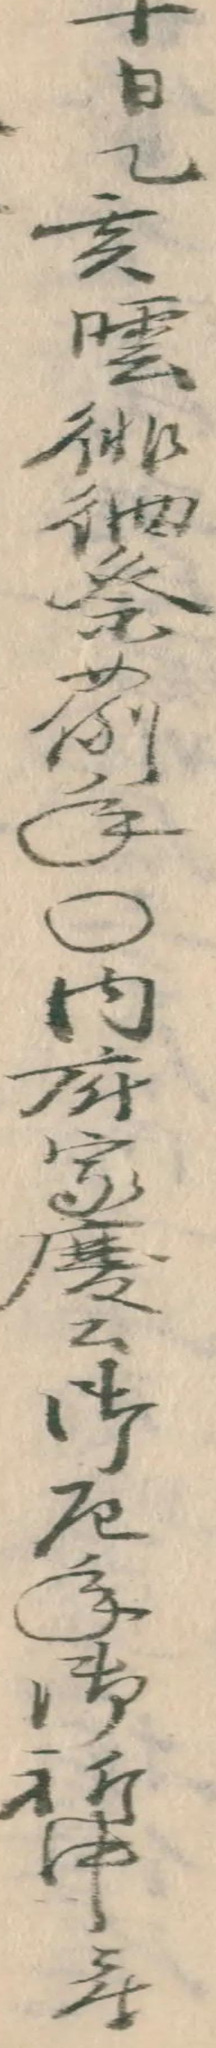十日乙亥曇徘徊祭如例年○内府家慶公御厄年御祈中ニ付
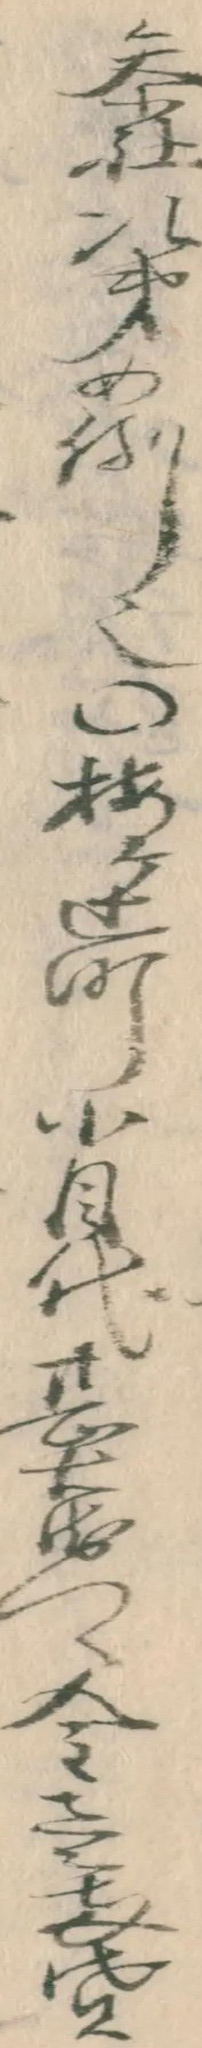参社次第如例也○梅ケ辻町小目代甚右衛門へ金壱両貸
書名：賀茂社記録. 第66冊
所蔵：国立国会図書館 National Diet Library, JAPAN
